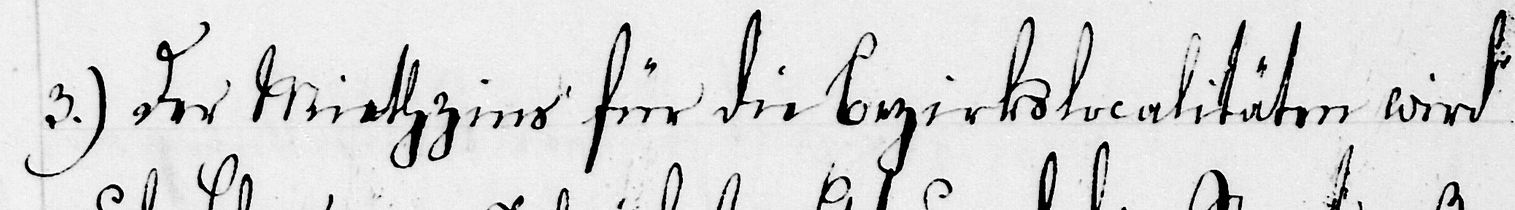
3.) Der Miethzins für die Bezirkslocalitäten wird
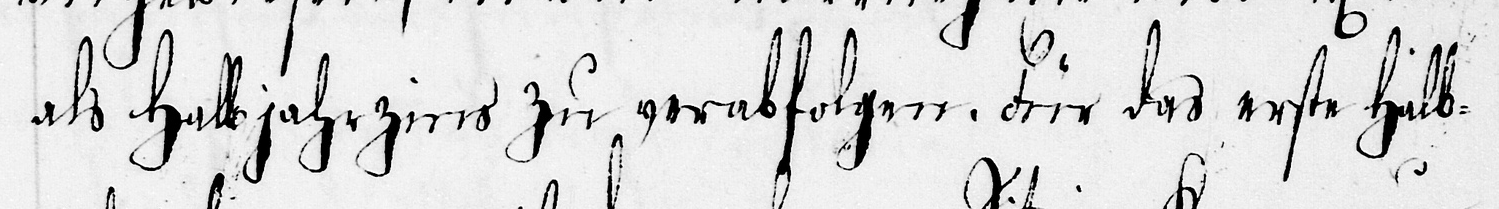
als Halbjahrzins zu verabfolgen. Für das erste Halb¬
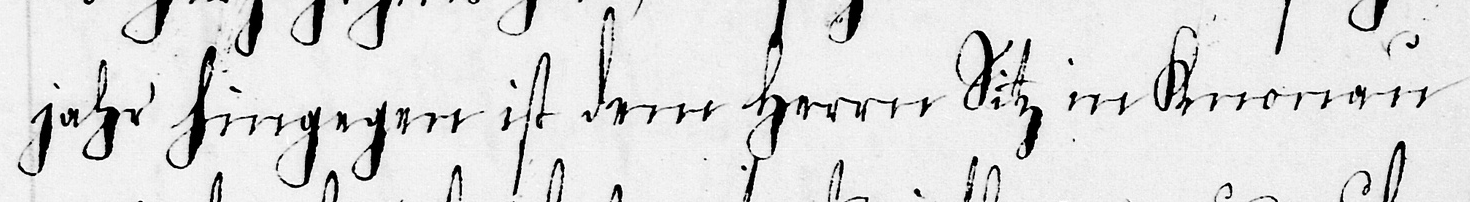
jahr hingegen ist dem Herrn Sitz in Knonau
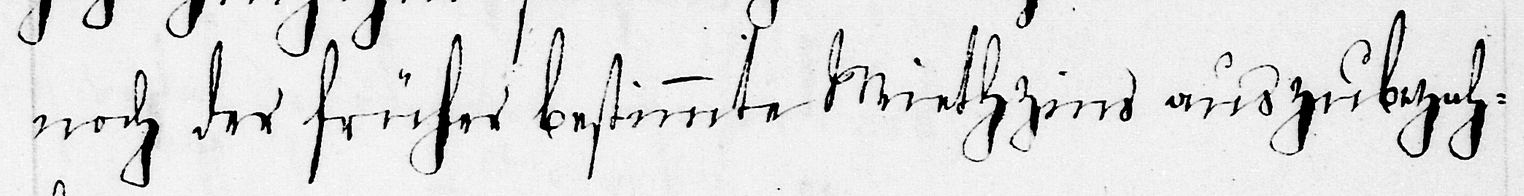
noch der früher bestimmte Miethzins auszubezah¬
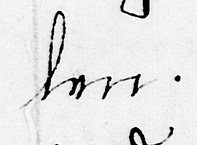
len.
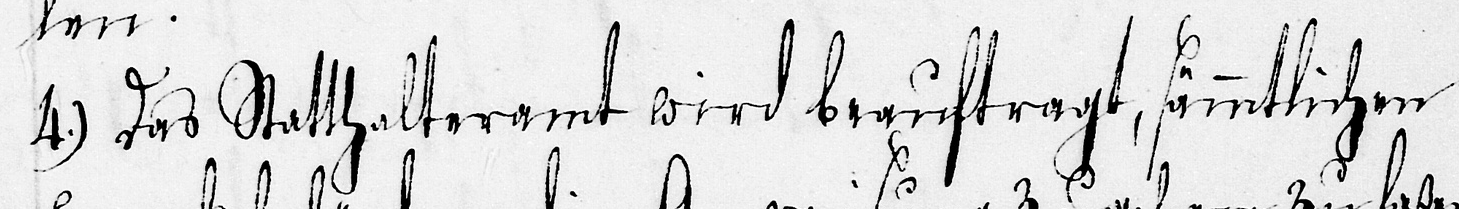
4.) Das Statthalteramt wird beauftragt, sämmtlichen
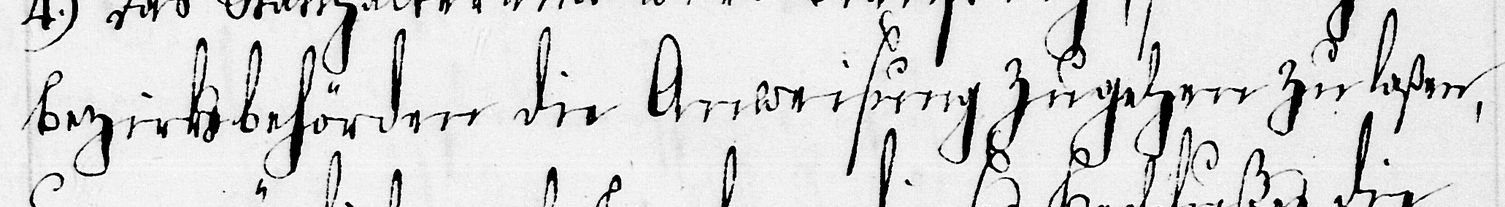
Bezirksbehörden die Anweisung zugehen zu laßen,
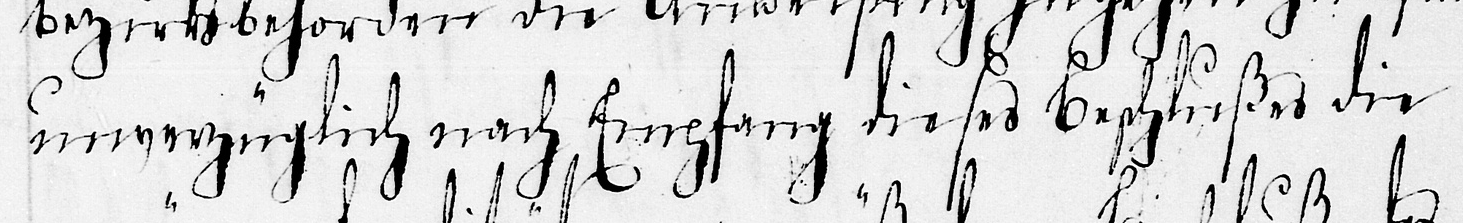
unverzüglich nach Empfang dieses Beschlußes die
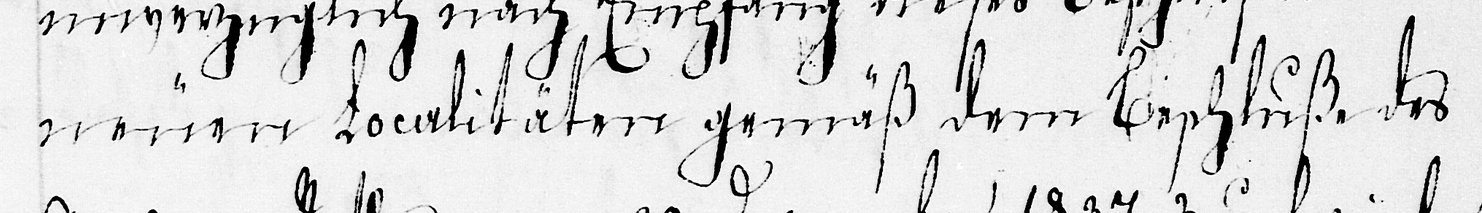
neuen Localitäten gemäß dem Beschluße des
